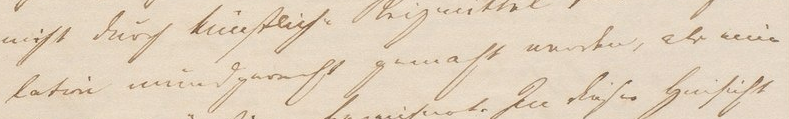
lation mundgerecht gemacht werden, als eine
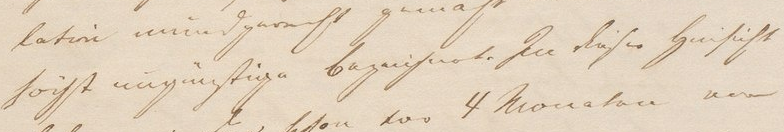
höchst ungünstige bezeichnet. In dieser Hinsicht
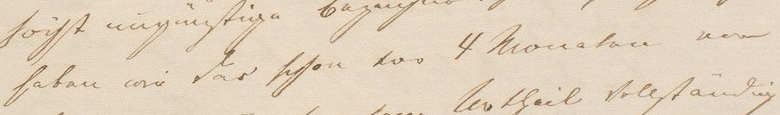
haben wir das schon vor 4 Monaten von
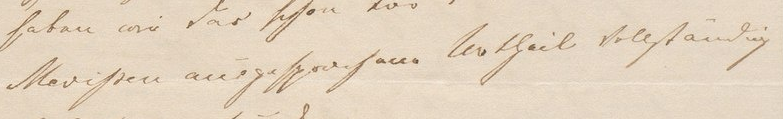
Mevissen ausgesprochene Urtheil vollständig
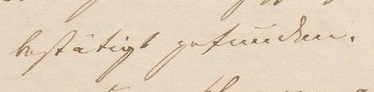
bestätigt gefunden.
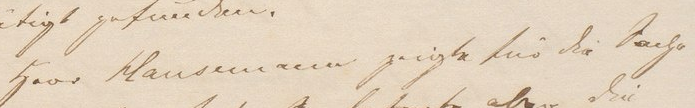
Herr Hansemann zeigte für die Sache
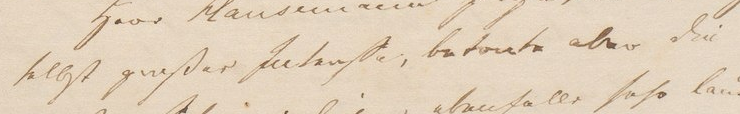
selbst großes Intereße, betonte aber die
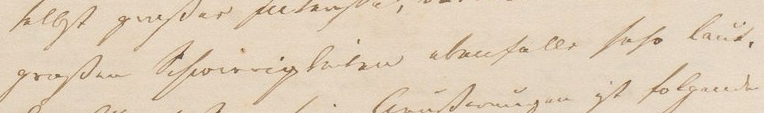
großen Schwierigkeiten ebenfalls sehr laut.
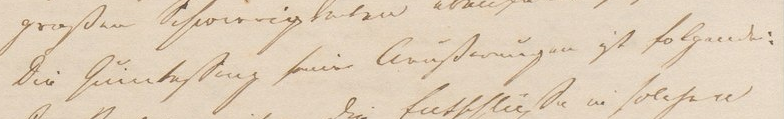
Die Quinteßenz seiner Aeußerungen ist folgende:
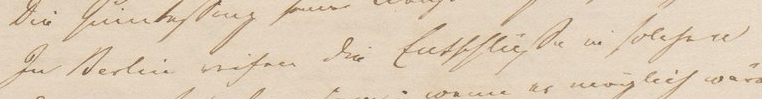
In Berlin reifen die Entschlüße in solchen
